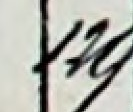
129
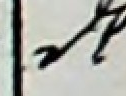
Do
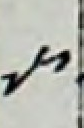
Do
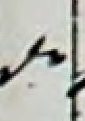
Do
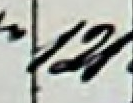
121
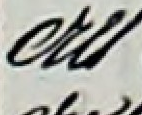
Alt
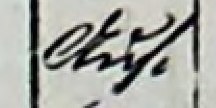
Aus„
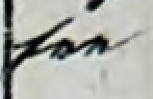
see
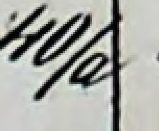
?40/a
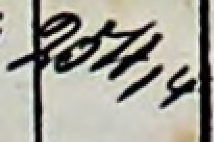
254,4
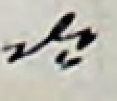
Do
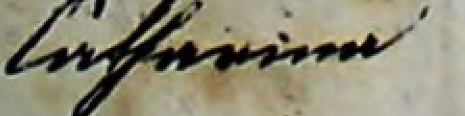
Catharina
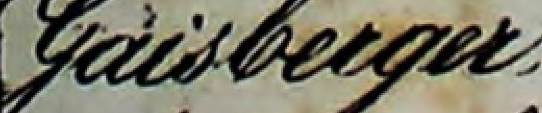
Gaisberger
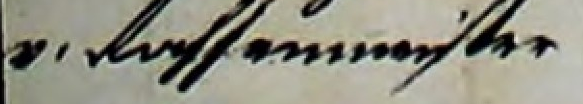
v. Rassenmeister
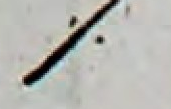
./.
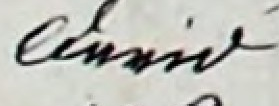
David
